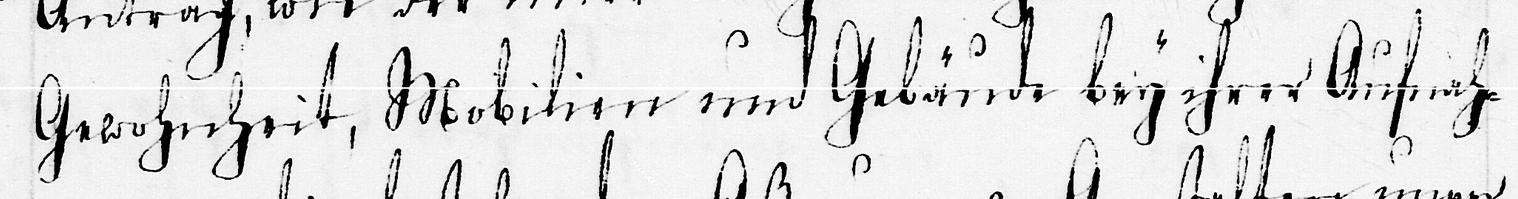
Gewohnheit, Mobilien und Gebäude bey ihrer Aufnah¬
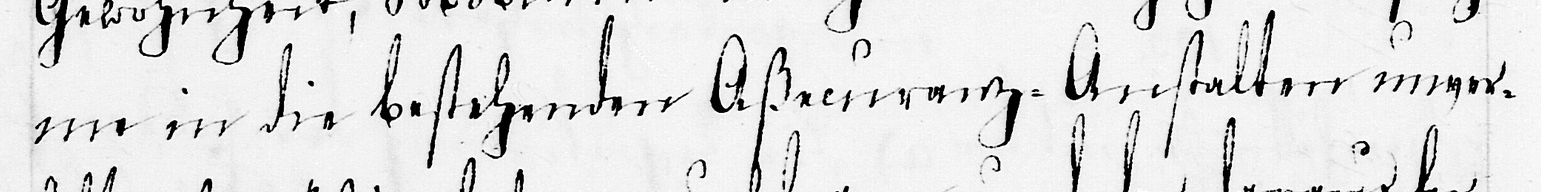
me in die bestehenden Aßecuranz-Anstalten unver¬
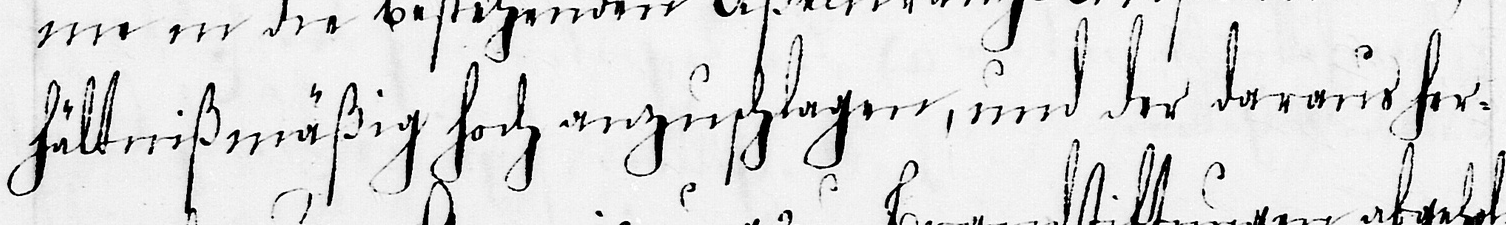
hältnißmäßig hoch anzuschlagen, und der daraus her¬
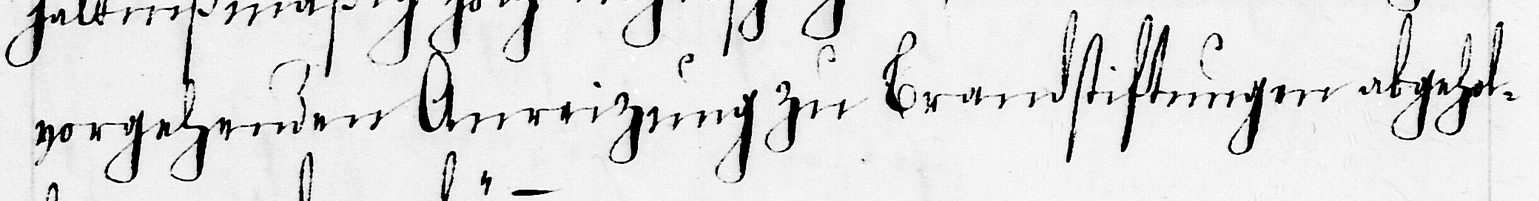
vorgehenden Anreizung zu Brandstiftungen abgehol¬
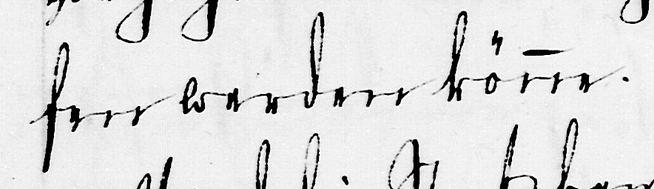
fen werden könne.
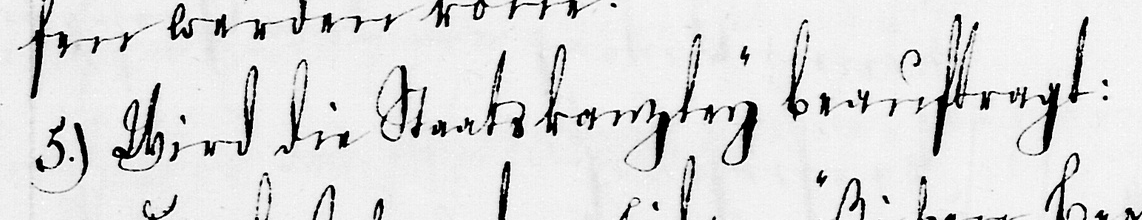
5.) Wird die Staatskanzley beauftragt:
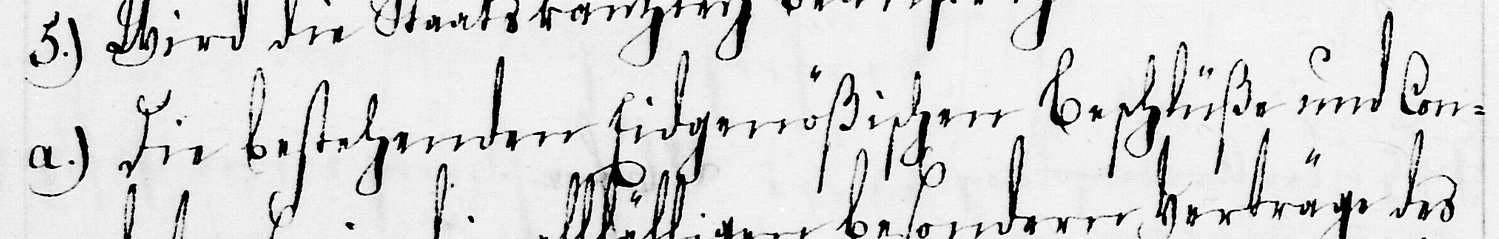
a.) Die bestehenden Eidgenößischen Beschlüße und Con¬
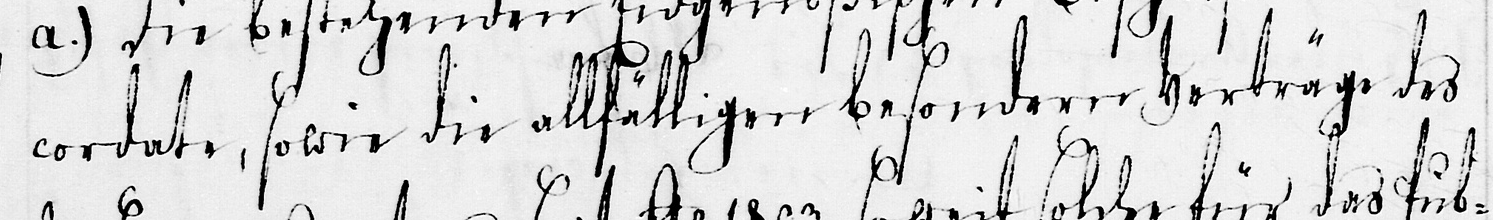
cordate, sowie die allfälligen besondern Verträge des
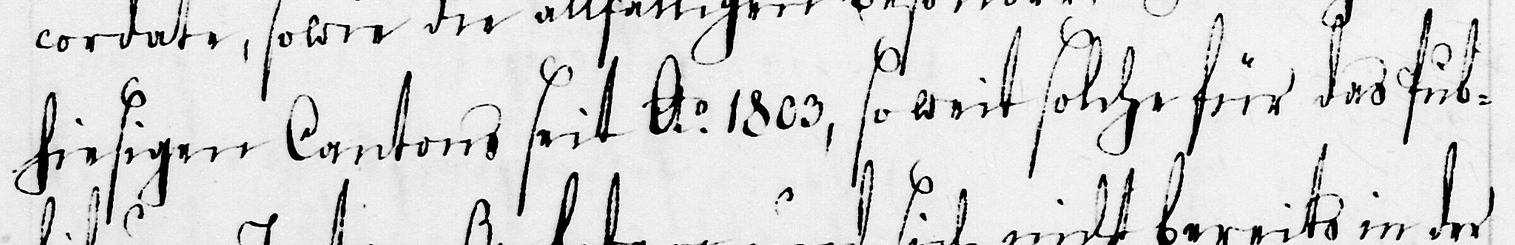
hiesigen Cantons seit Ao. 1803, so weit solche für das Pub¬
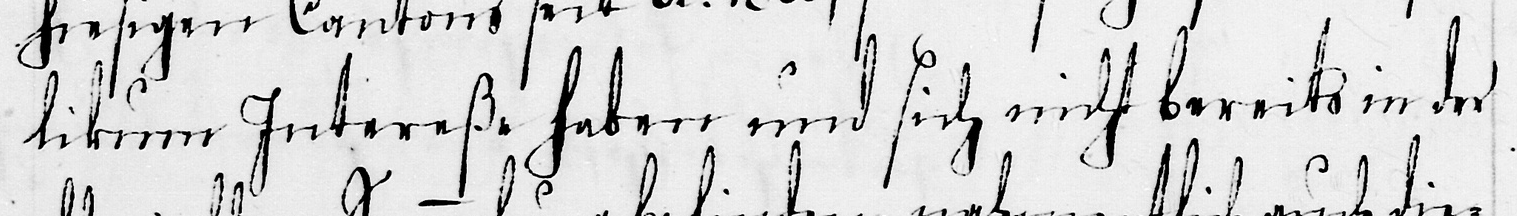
likum Intereße haben und sich nicht bereits in der
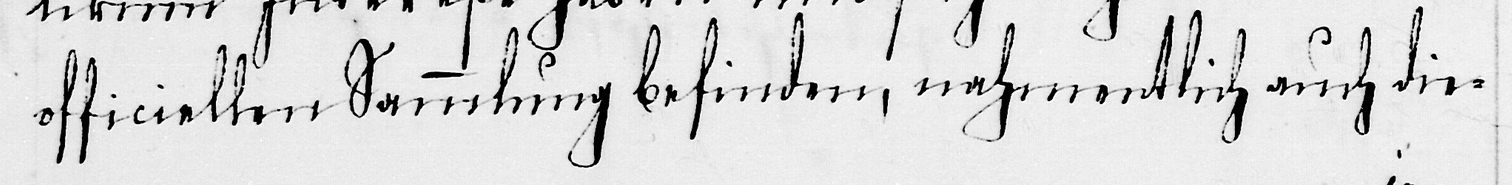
officiellen Sammlung befinden, nahmentlich auch die-
